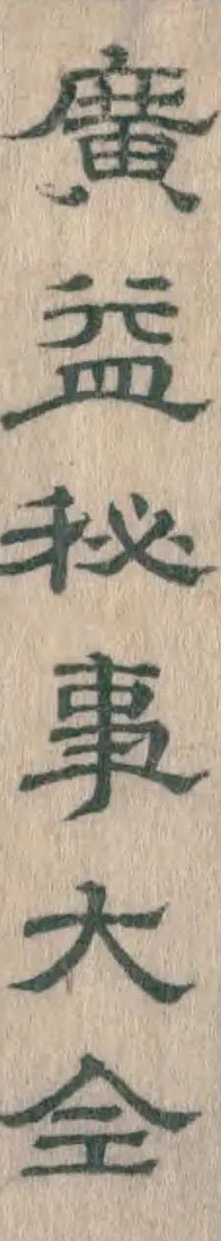広益秘事大全
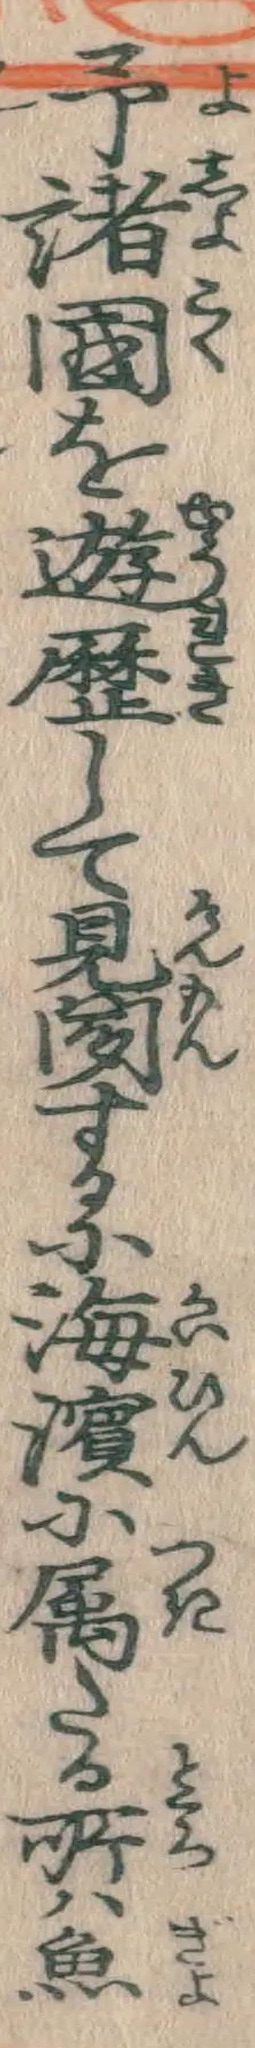予諸国を遊歴して見聞するに海浜に属たる所は魚
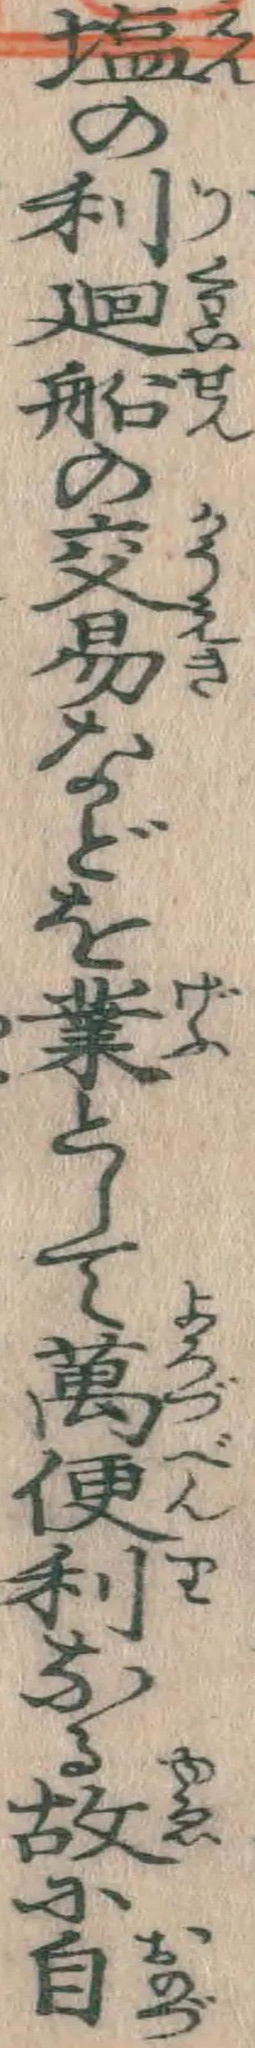塩の利廻船の交易などを業として万便利なる故に自
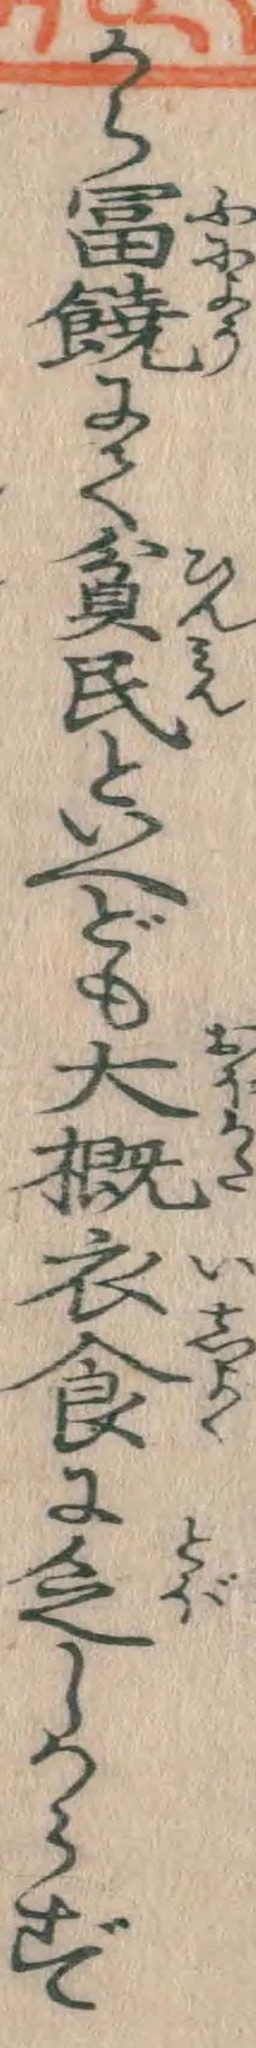から富饒にて貧民といへども大概衣食に乏しからず
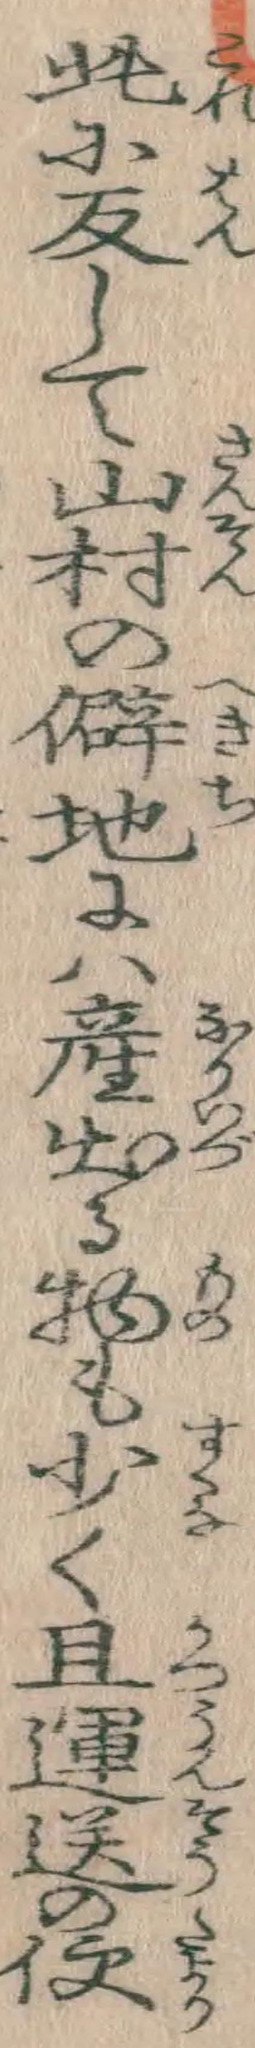此に反して山村の僻地には産出る物も少く且運送の便
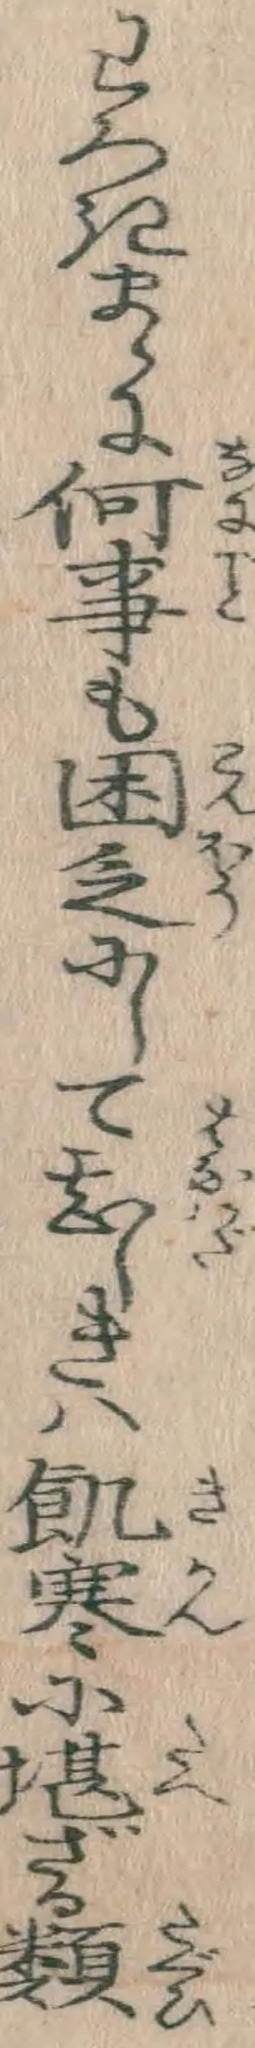わろきまゝに何事も困乏にして甚しきは飢寒に堪ざる類
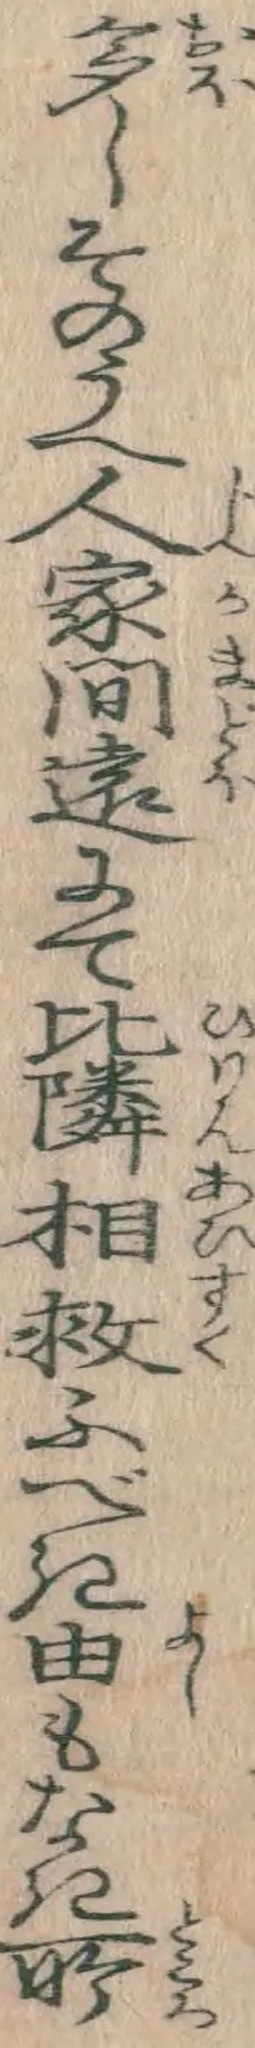多しそのうへ人家間遠にて比隣相救ふべき由もなき所
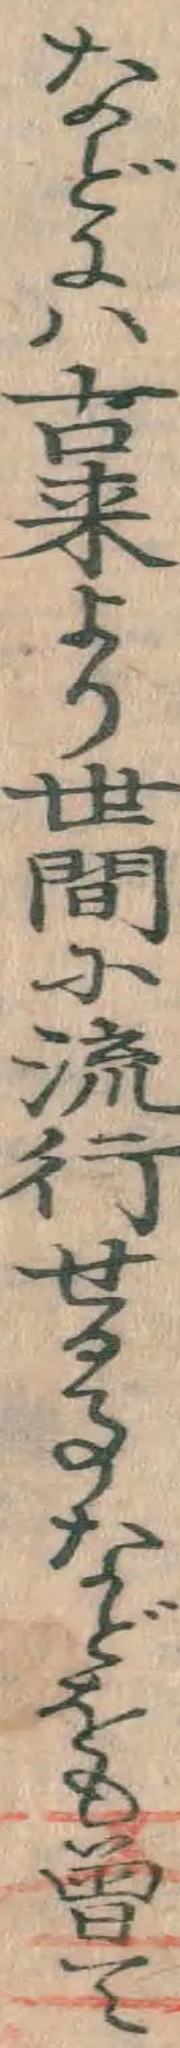などには古来より世間に流行せる事などをも曽て
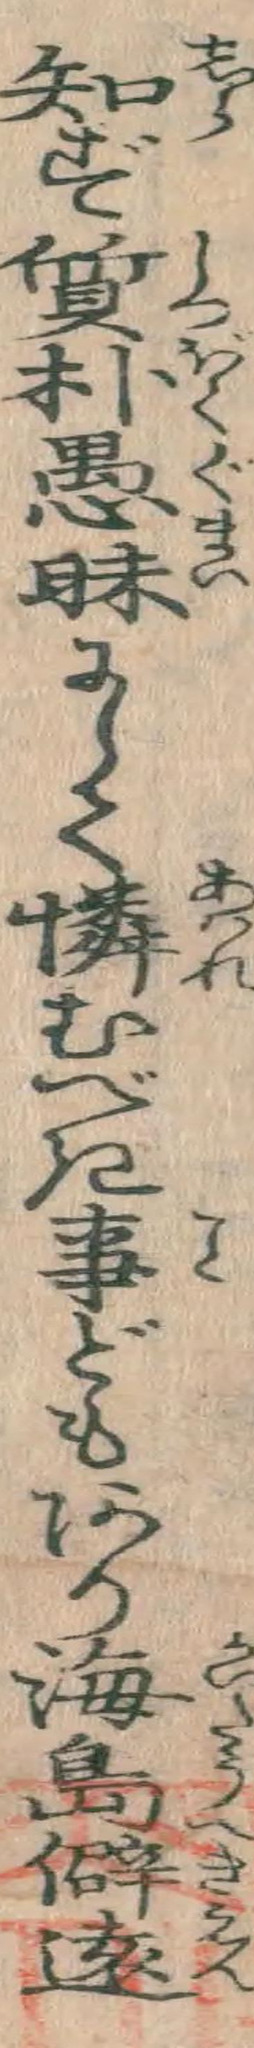知ず質朴愚昧にして憐むべき事どもあり海島僻遠
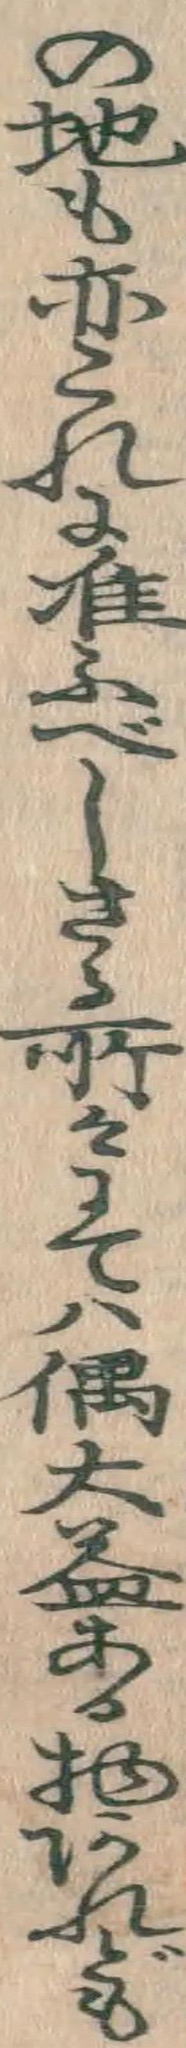の地も亦これに准ふべしさる所々にては偶大益ある物あれども
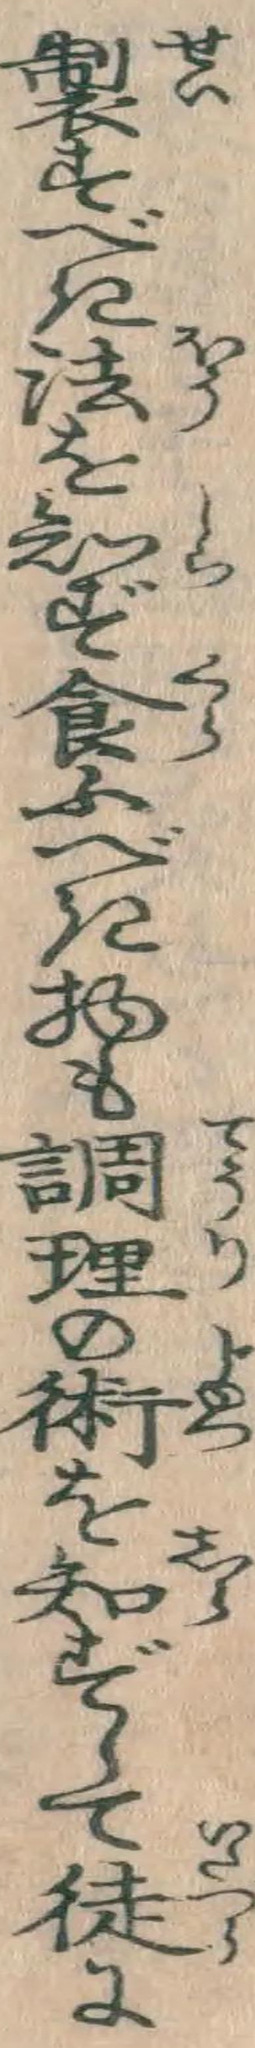製すべき法を知ず食ふべき物も調理の術を知ずして徒に
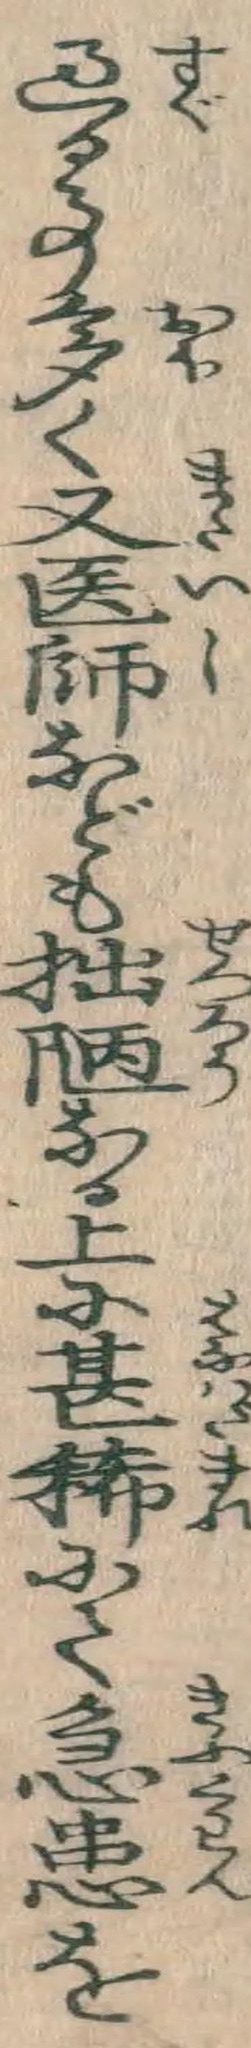過る事多く又医師なども拙陋なる上に甚稀にて急患を
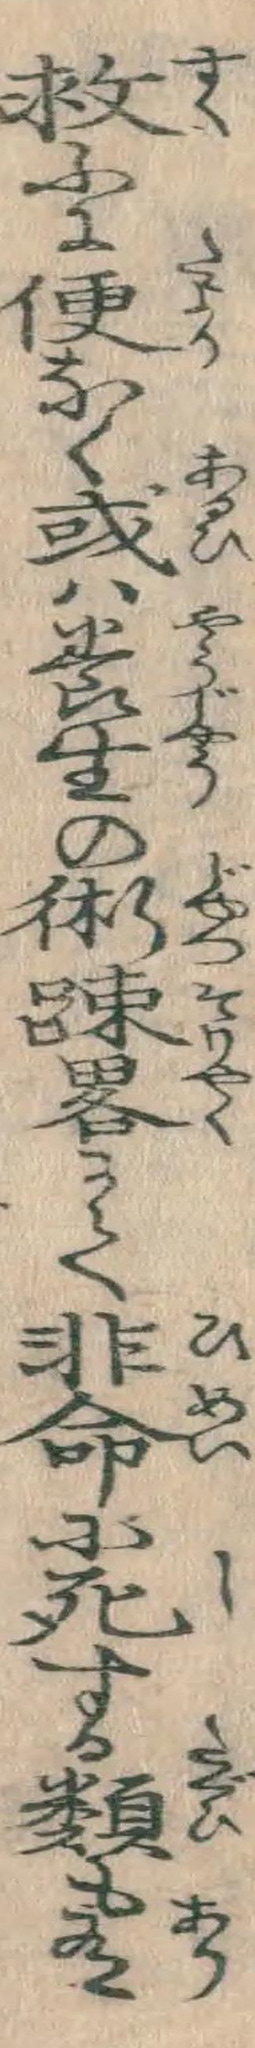救ふに便なく或は養生の術踈略にて非命に死する類も有
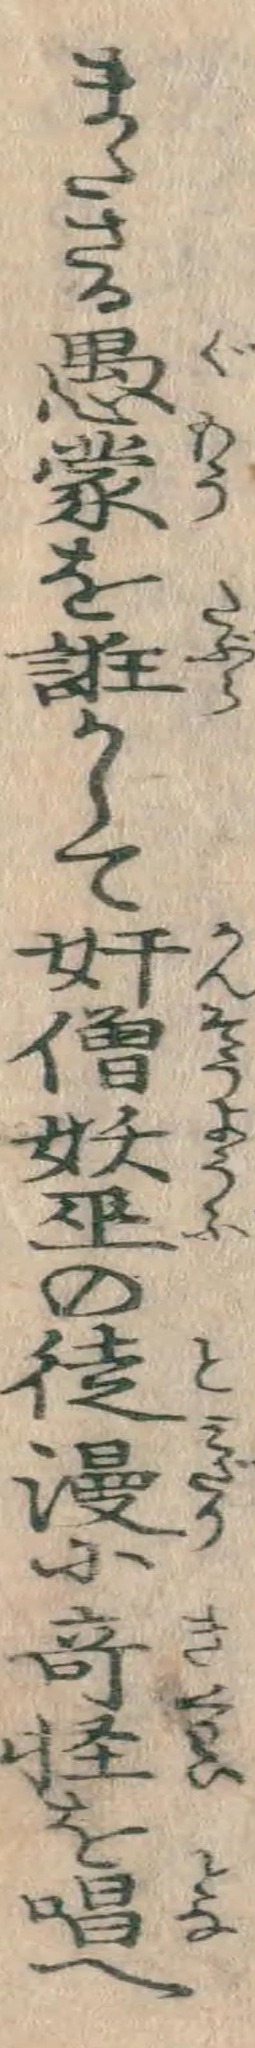またさる愚蒙を誑かして奸僧妖巫の徒漫に奇怪を唱へ
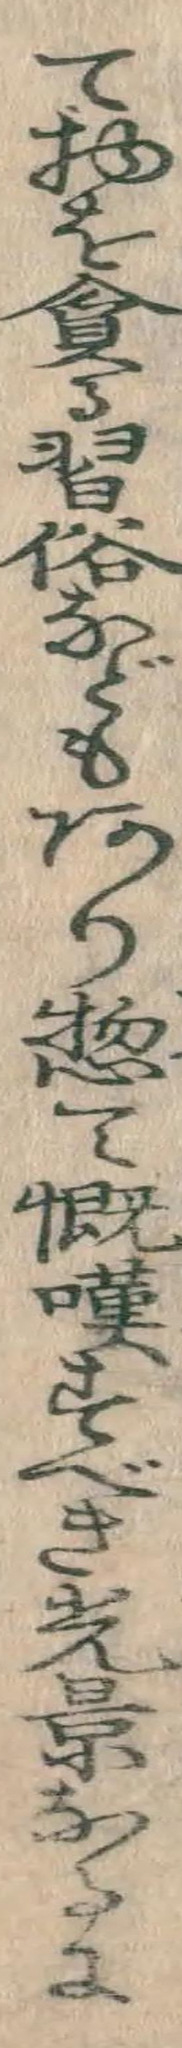て物を貧る習俗などもあり惣て慨嘆すべき光景なるに
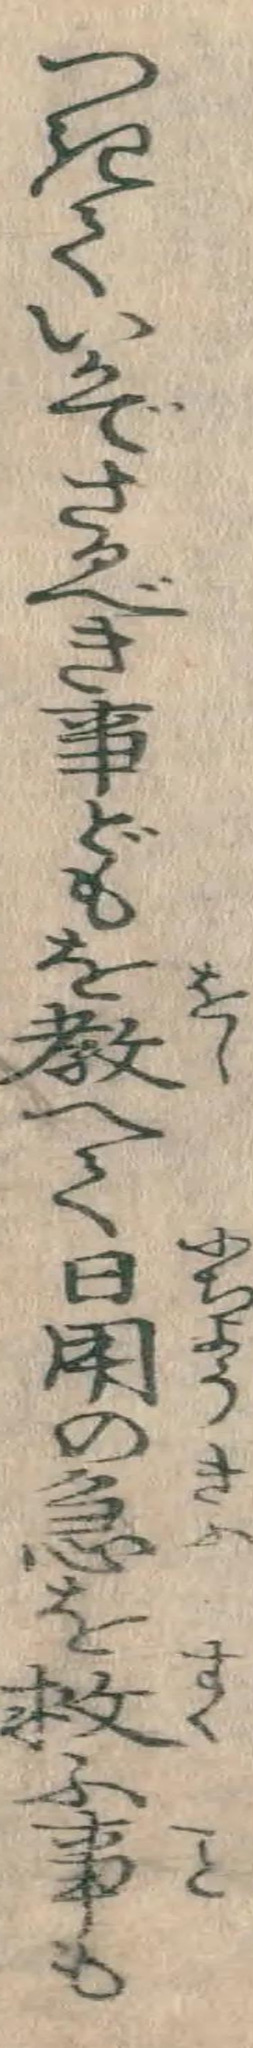つきていかでさるべき事どもを教へて日用の急を救ふ事も
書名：広益秘事大全 3巻. [1]
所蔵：国立国会図書館 National Diet Library, JAPAN
